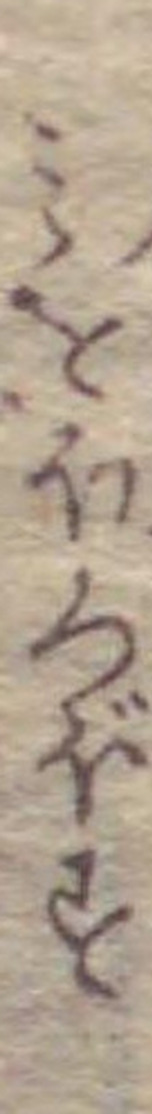みをほろぼす
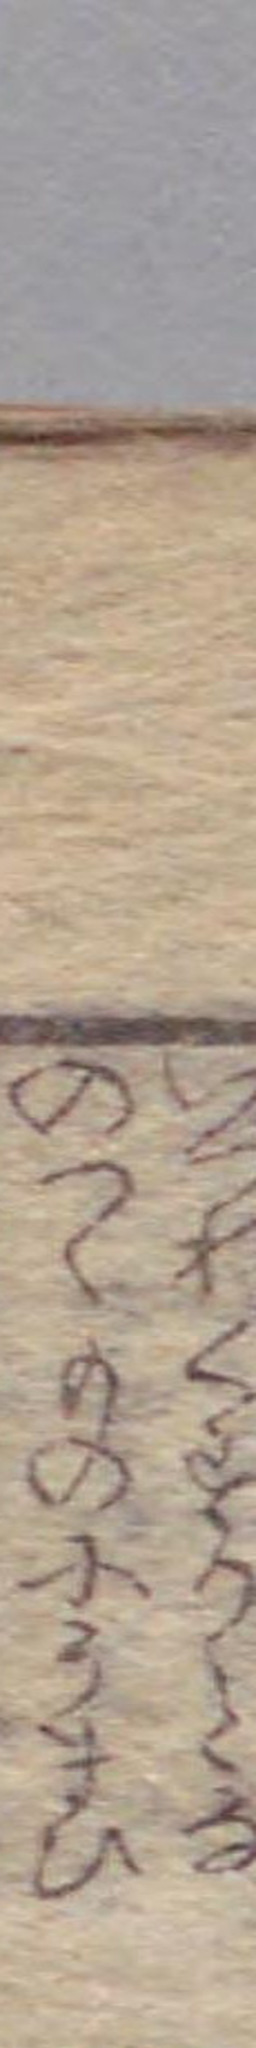のつくものにうまひ
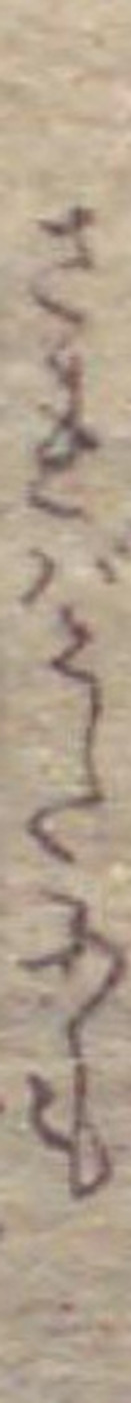さればうたにも
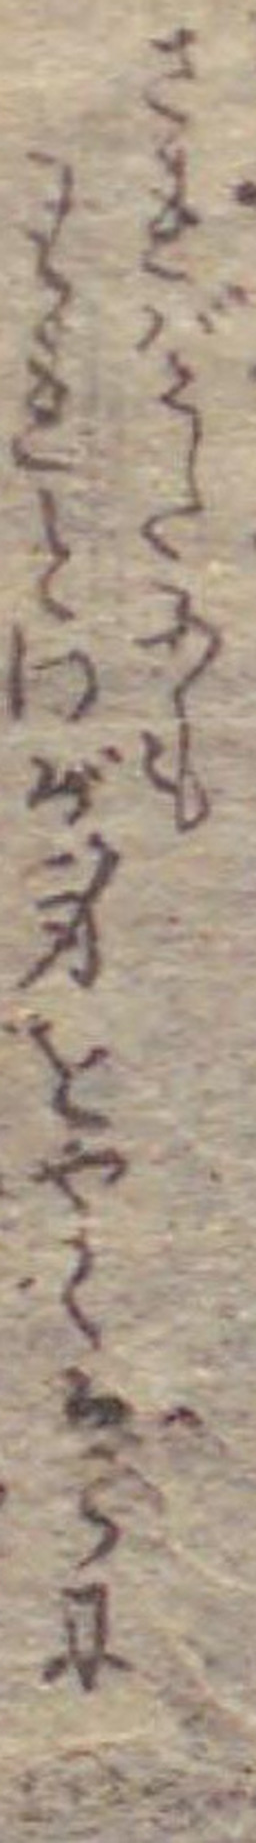われとわが身をやくからに

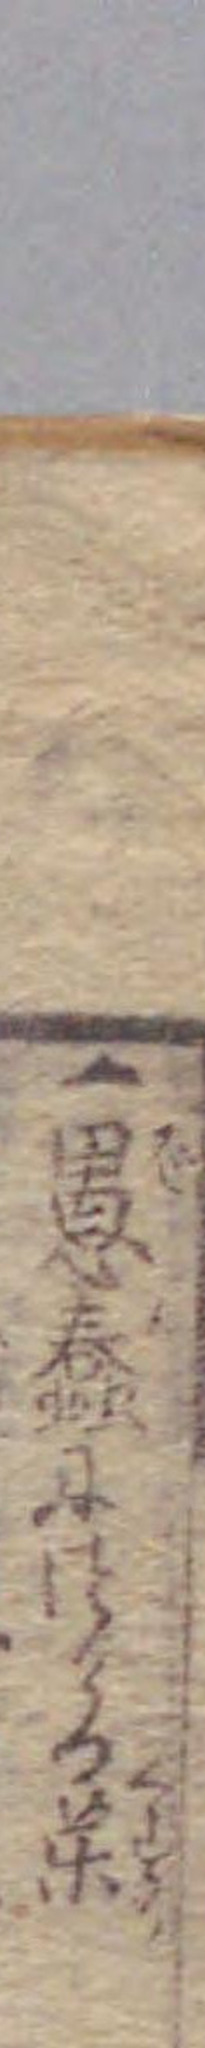▲愚蠢につける薬
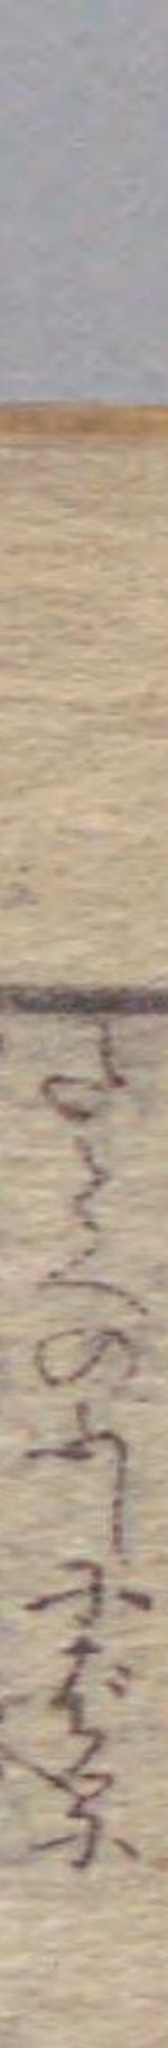たとへのふしにばかに
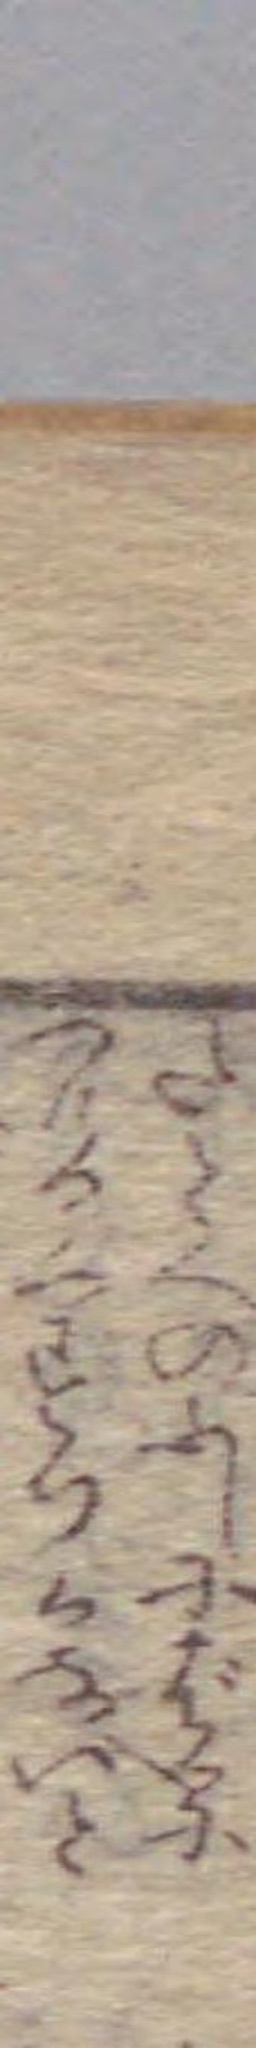つけるくすりがないと
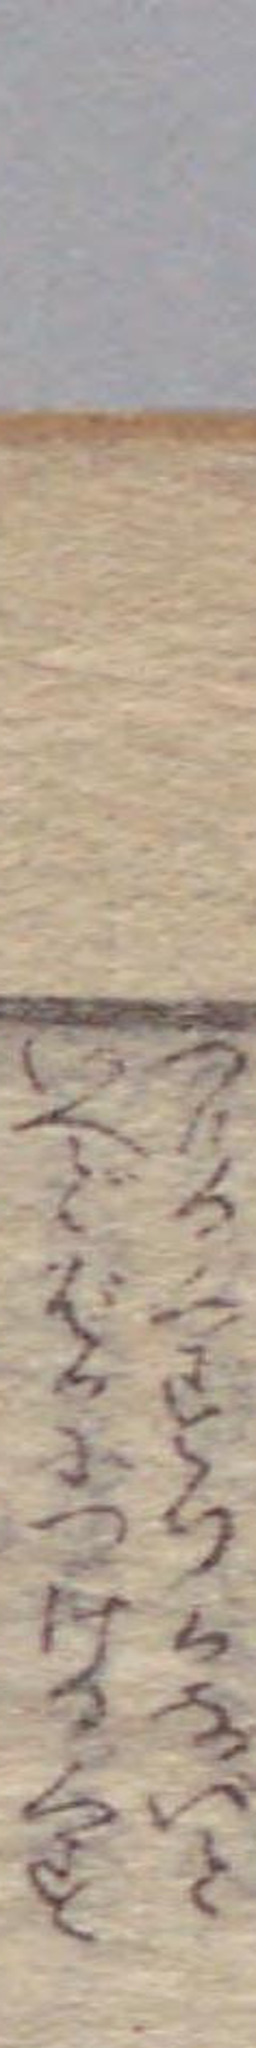いへどばかにつけるくす
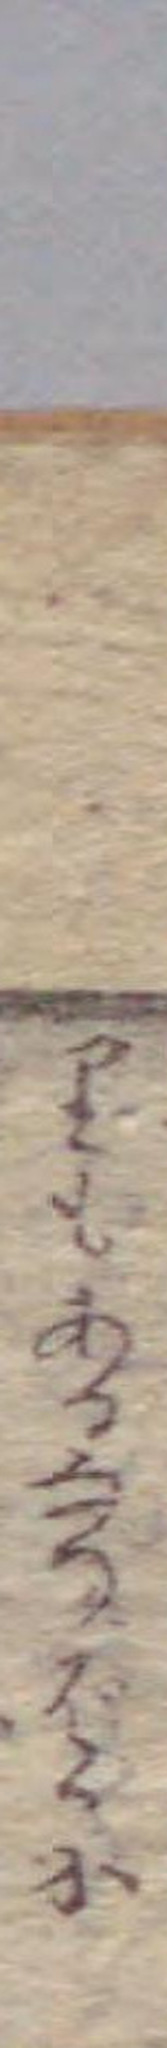りもあるなりばかに
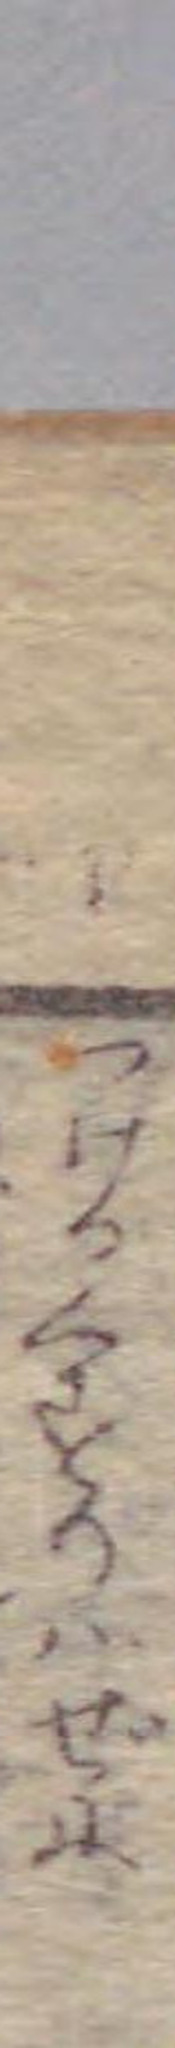つけるくすりはぜに
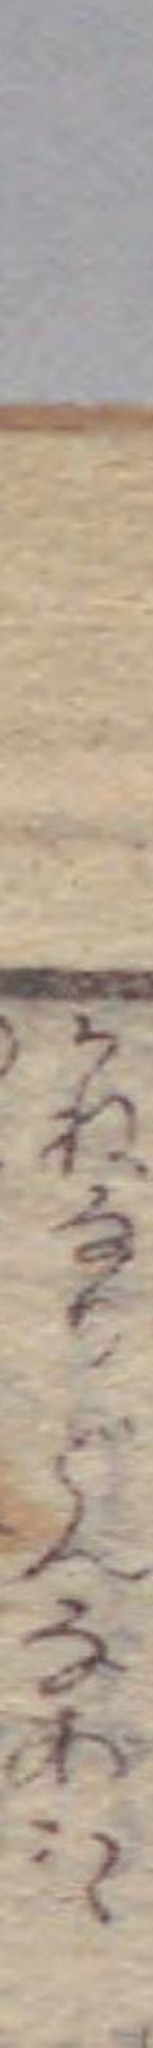かねなりどんなあわゝ
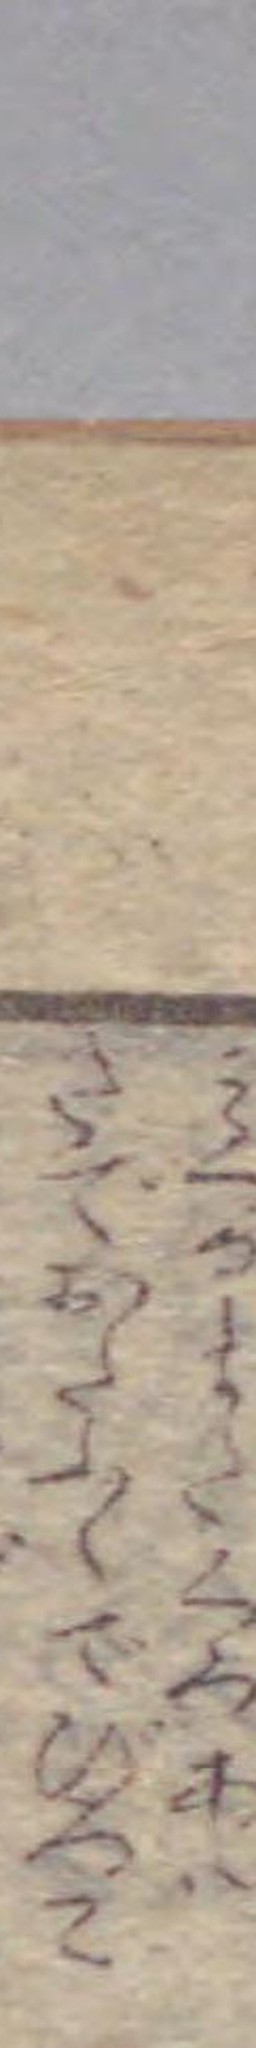たでおたふくでびっこ
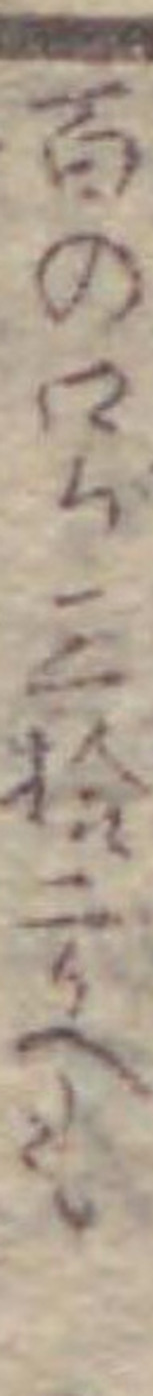百の口が三拾二かへも
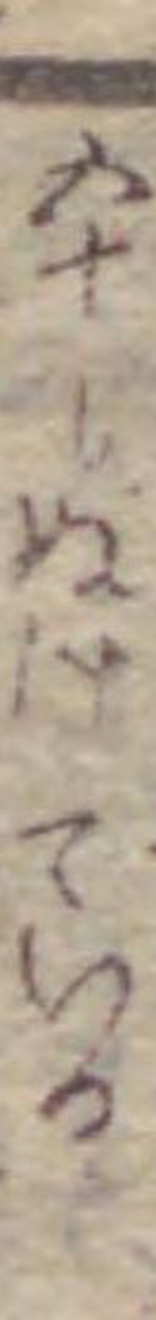五十もぬけている
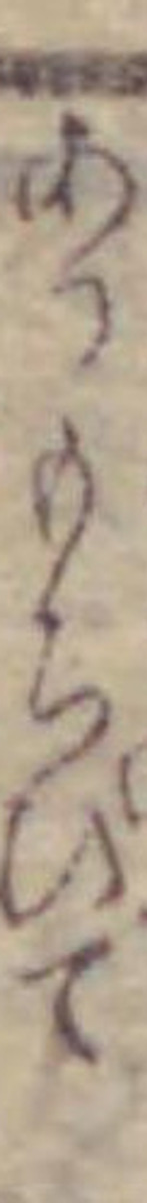ありもちひて
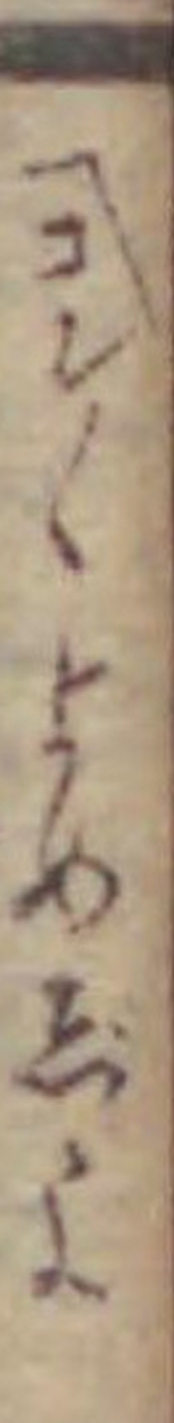〽コレ〳〵よめしよ
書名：鼻下長生薬 : 3巻
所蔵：国立国会図書館 National Diet Library, JAPAN
